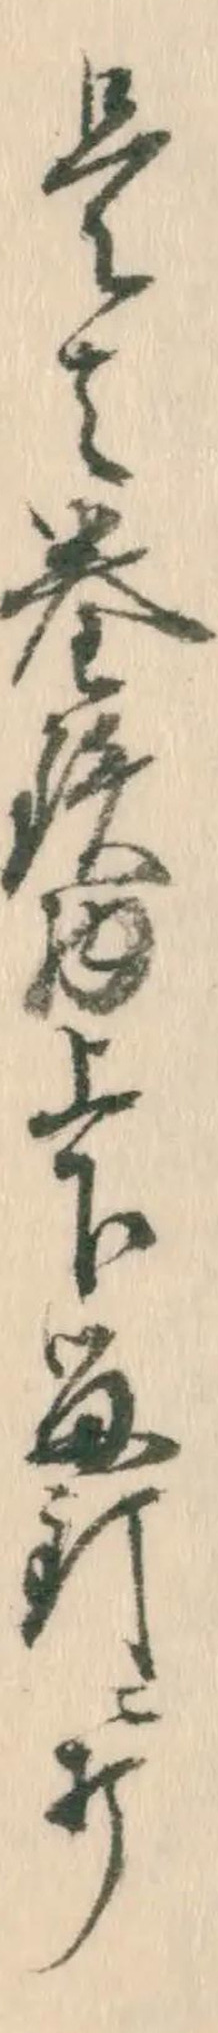是は巻鉄物上下留釘ニ打
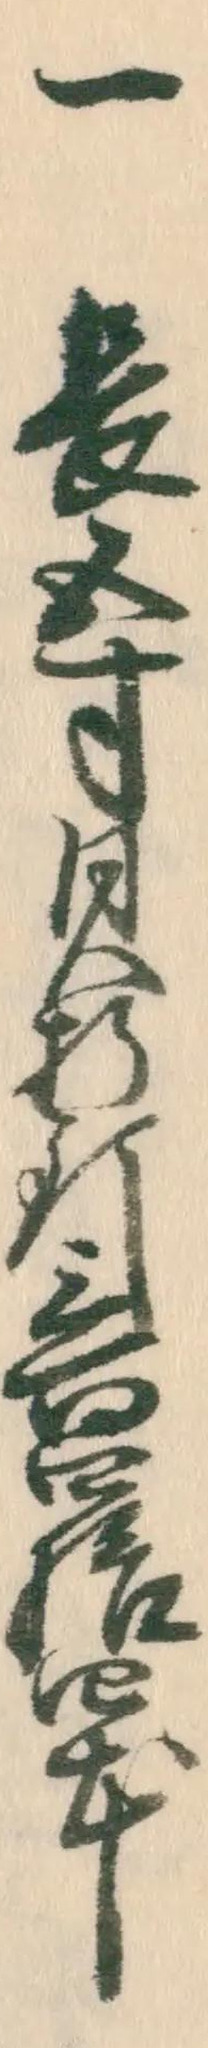一長五寸貝折釘三百四拾四本
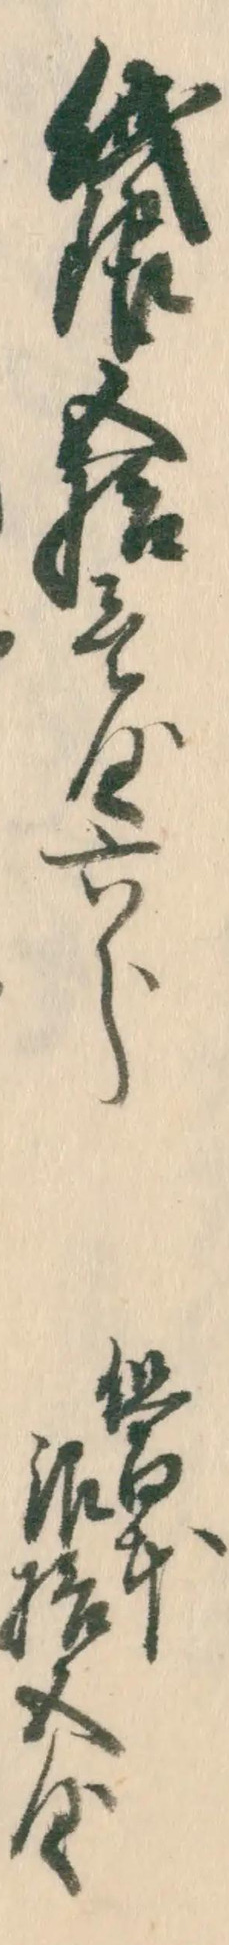代銀五拾壱匁六分但百本銀五匁
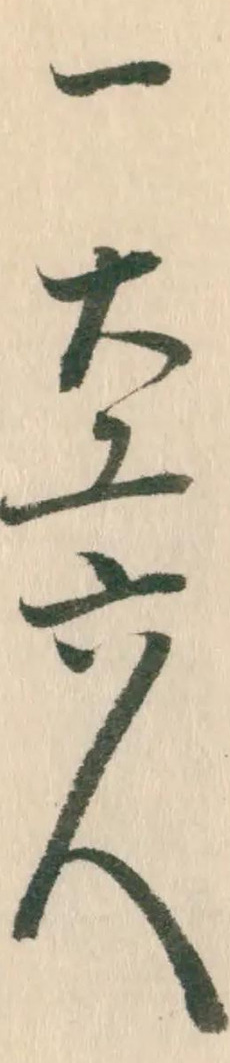一大工六人
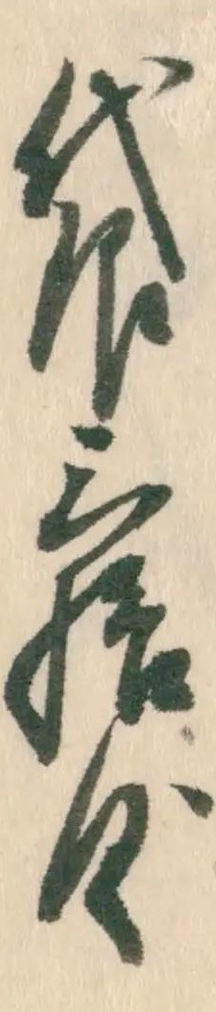代銀拾弐匁

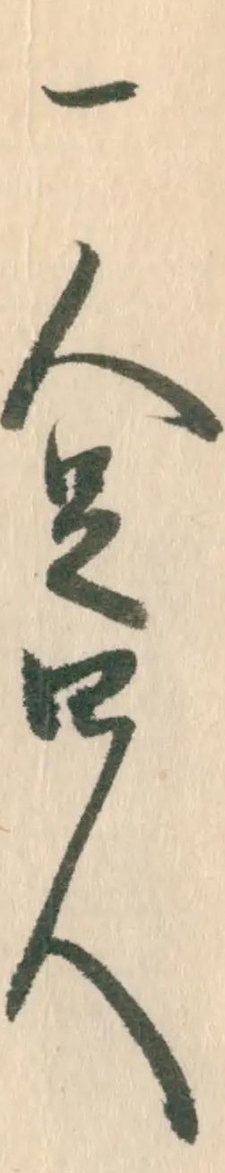一人足四人
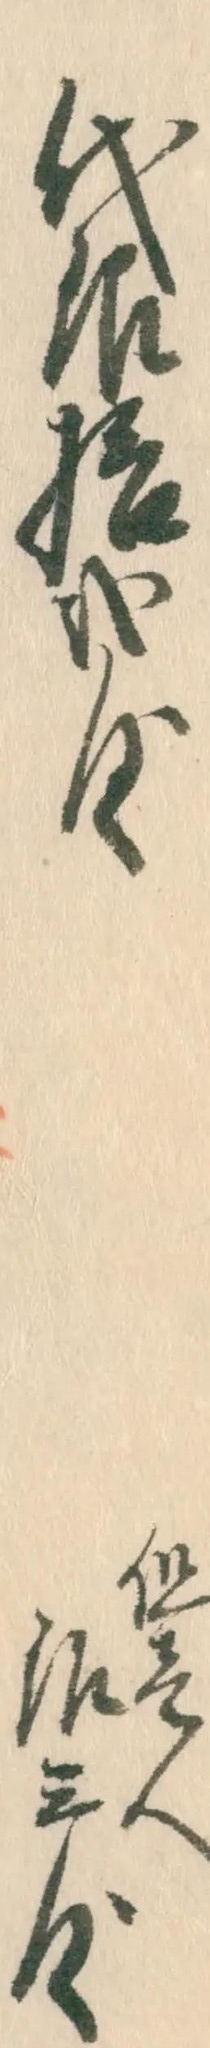代銀拾弐匁但壱人銀三匁
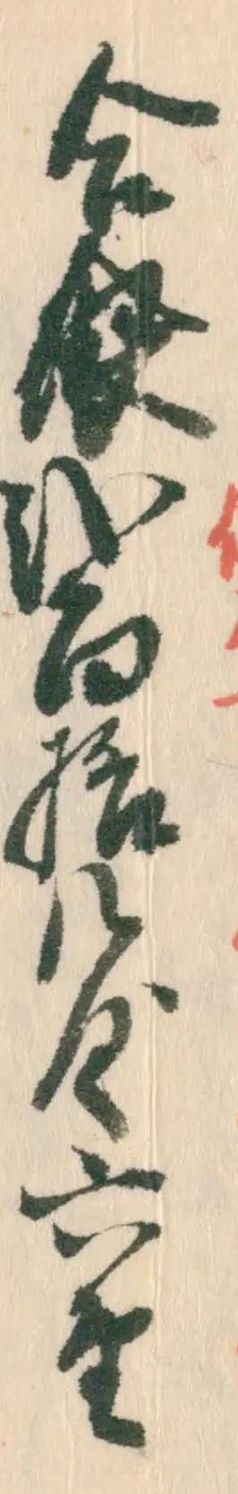合銀弐百拾八匁六厘
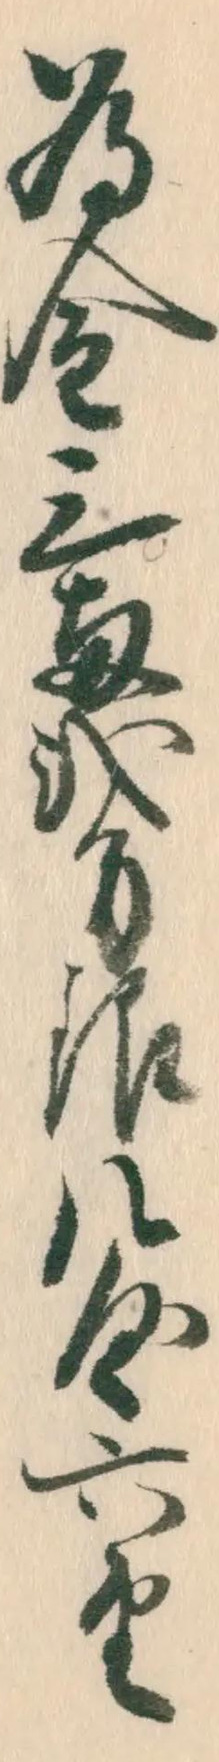為金三両弐分銀八匁六厘
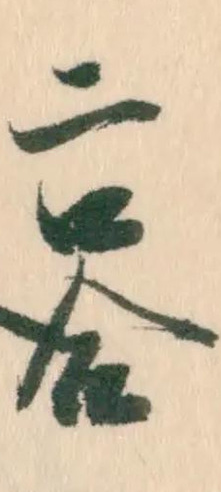二口合
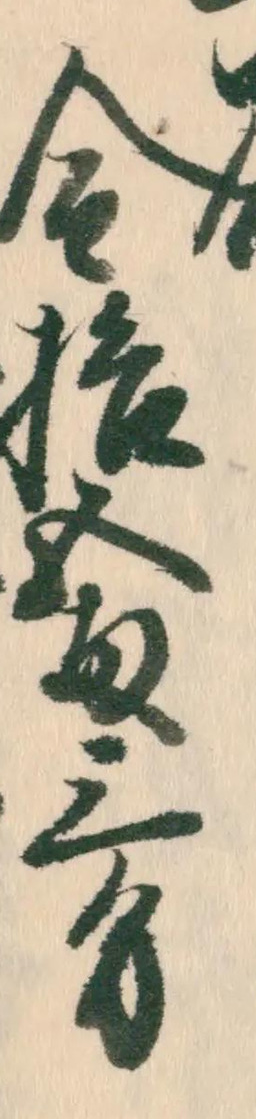金拾五両三分
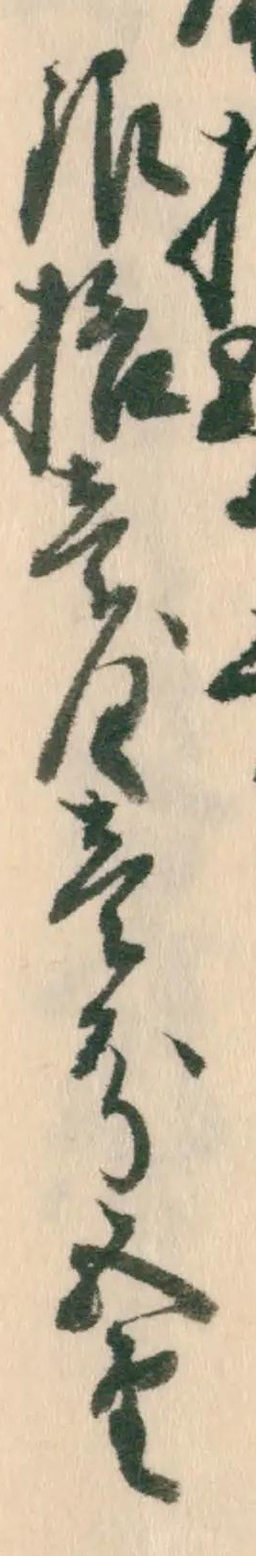銀拾壱匁壱分五厘
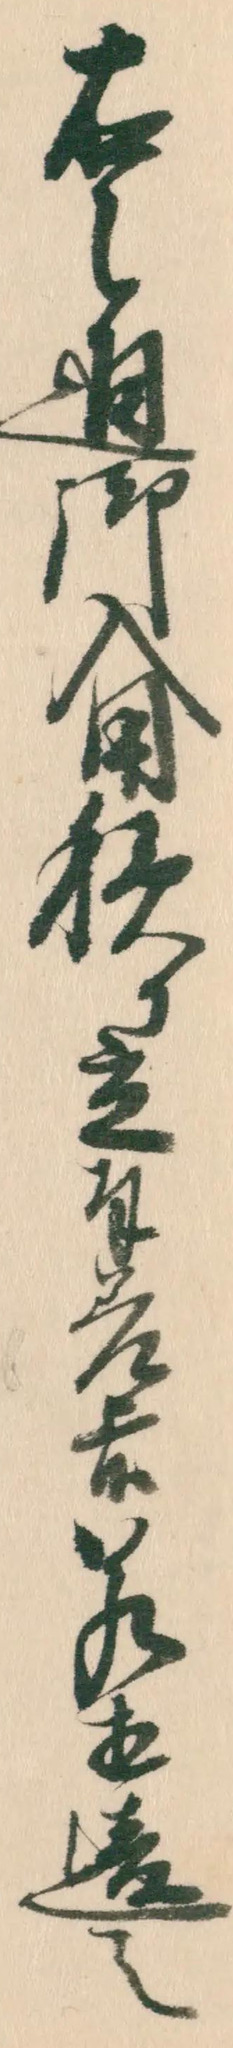右之通御入用積り立奉差上候若相違之
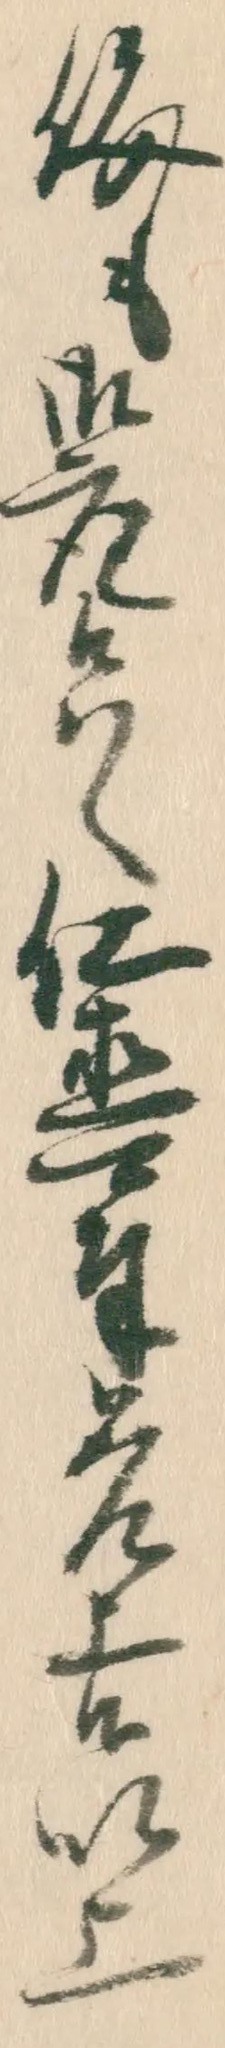儀も御座候ハヽ仕直可奉差上候以上
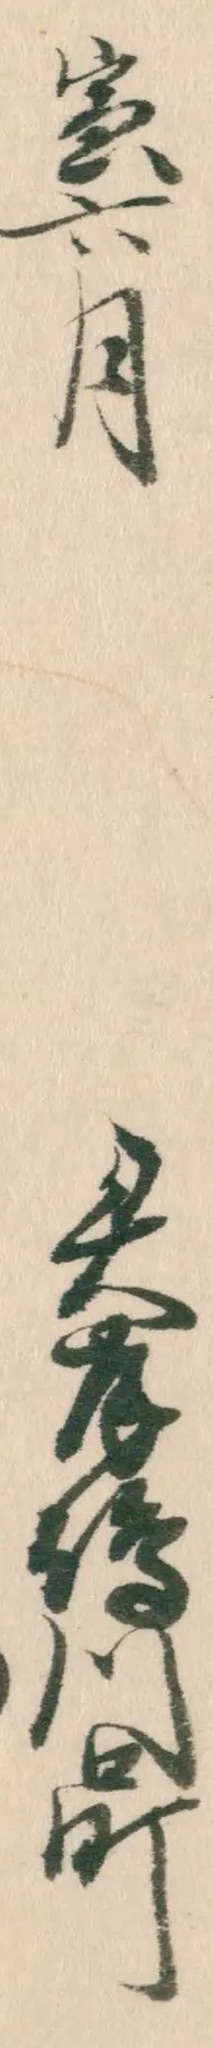寅六月霊岸島川口町

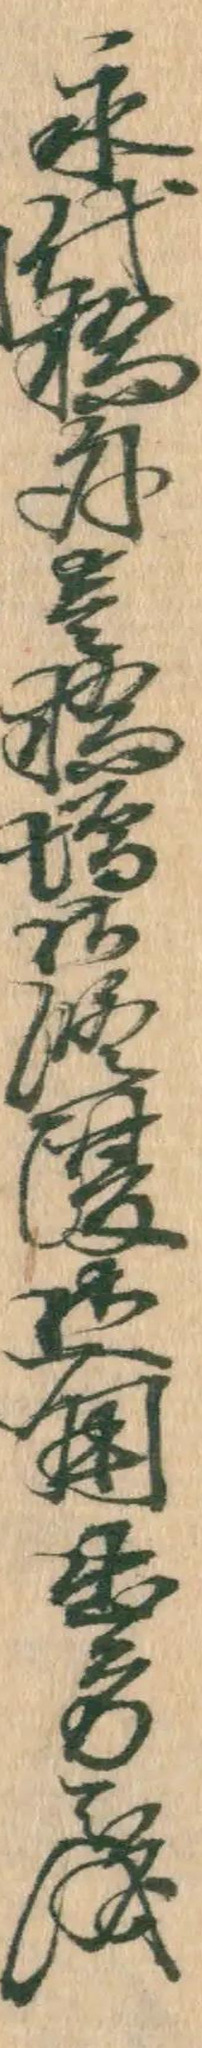永代橋外壱橋増御修復御入用出方之儀
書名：三橋 17巻. [8] 三橋小破御修復書留　但御奉行御掛リ替地震潰橋番屋　嘉永四亥年より安政二卯年迄　下
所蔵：国立国会図書館 National Diet Library, JAPAN
